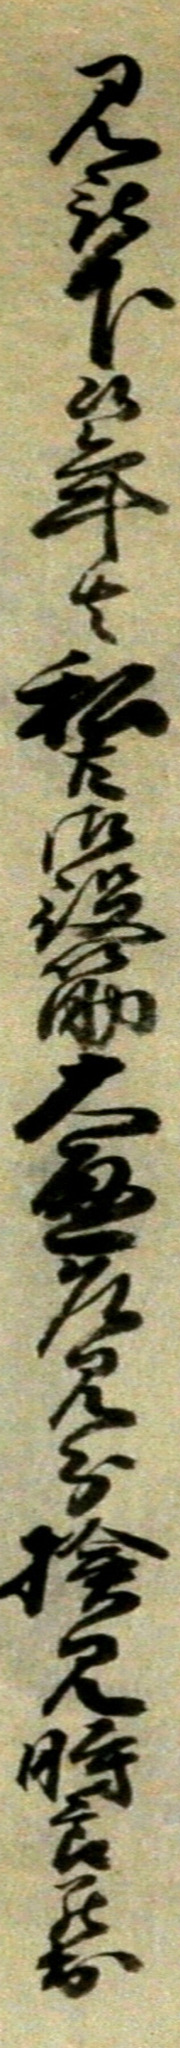見被下候年者私共御役筋大通乍見分検見時節罷出
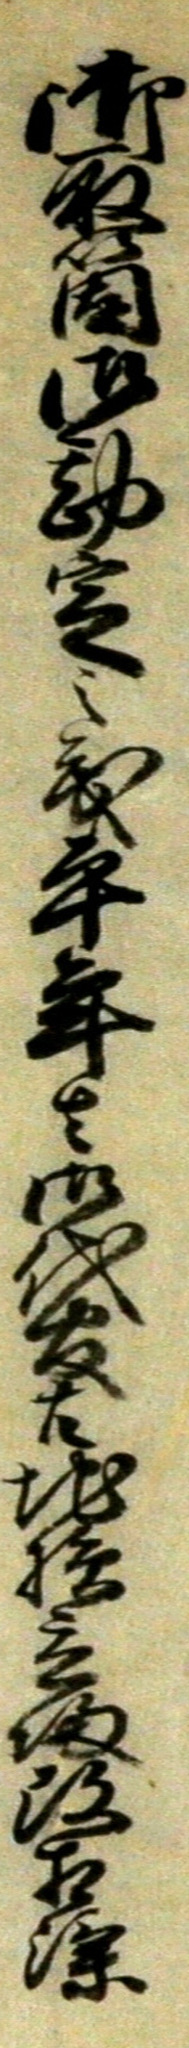一御取箇御勘定之義平年者御代官共地損立帰改相済
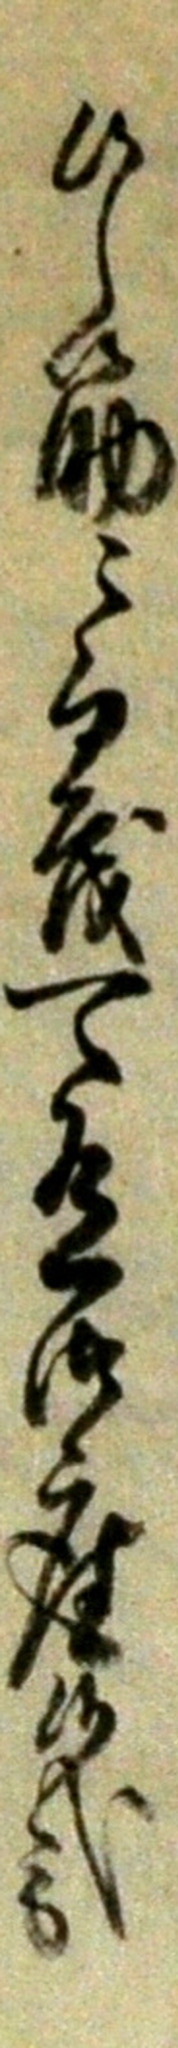候之筋ニ而茂可有御座候哉
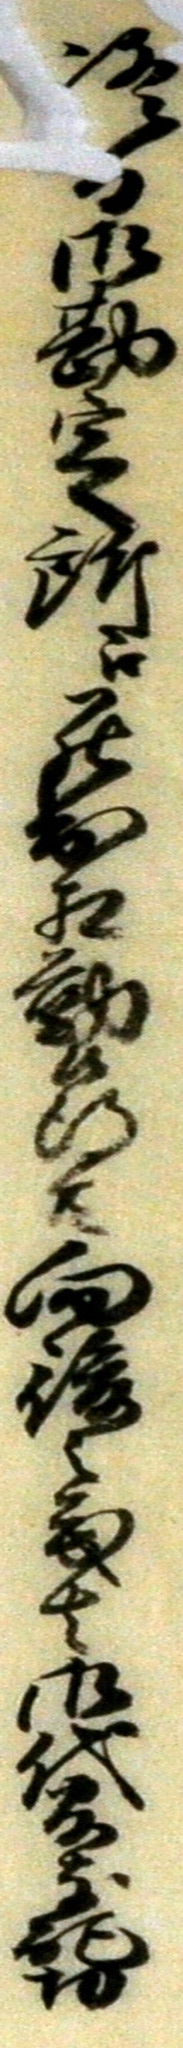終日御勘定所江罷出相勤候得共向後之義者御代官支配切
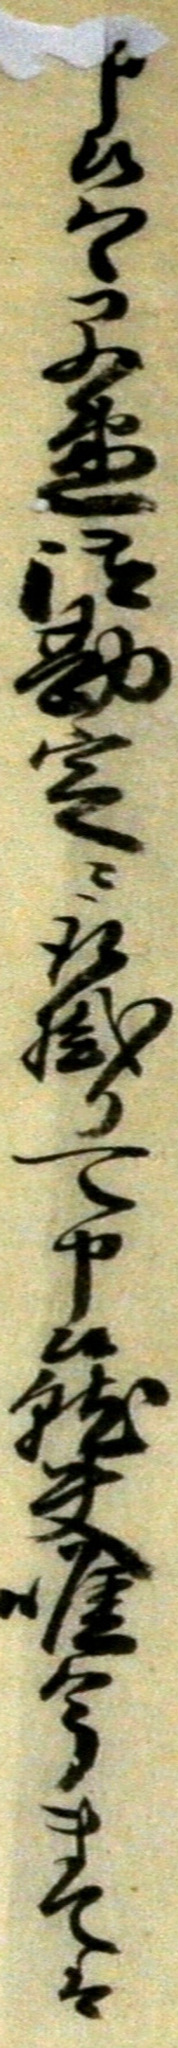申候ハヽ早速御勘定ニ取掛り可申候就夫唯今まては
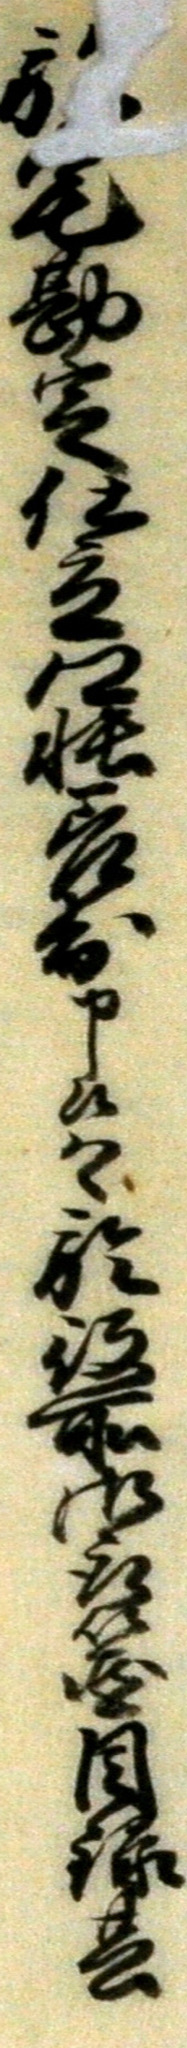於宅勘定仕立郷帳差出申候ハヽ於役所於取箇目録其
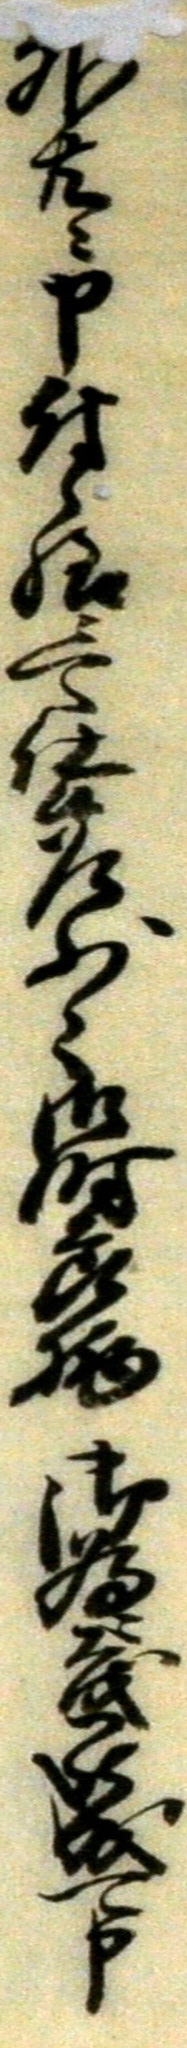外共ニ申付候様ニ可仕候乍少々御時節柄御為ニ茂罷成可申
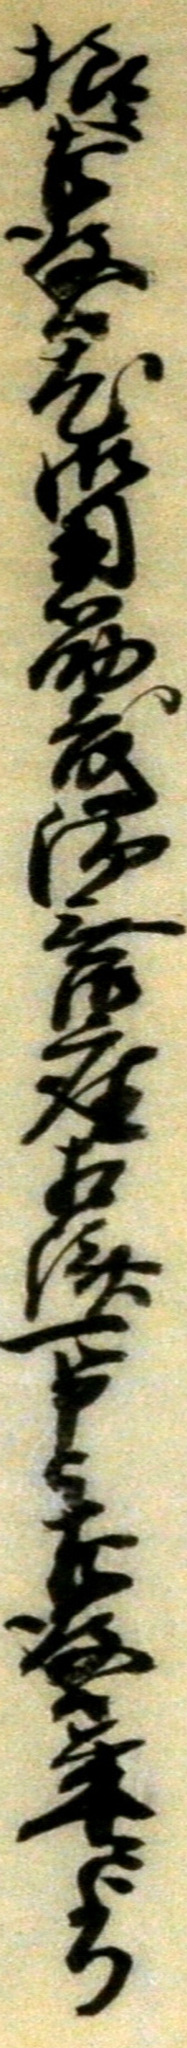様ニ奉存候尤御用筋茂滞無御座相済可申と奉存候年ニより
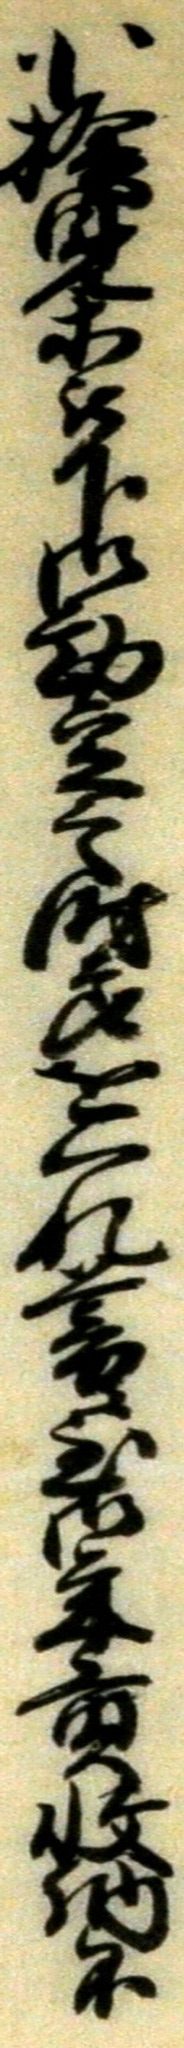小検見等被下御勘定之時節を一札暮ニ至御年貢収納不
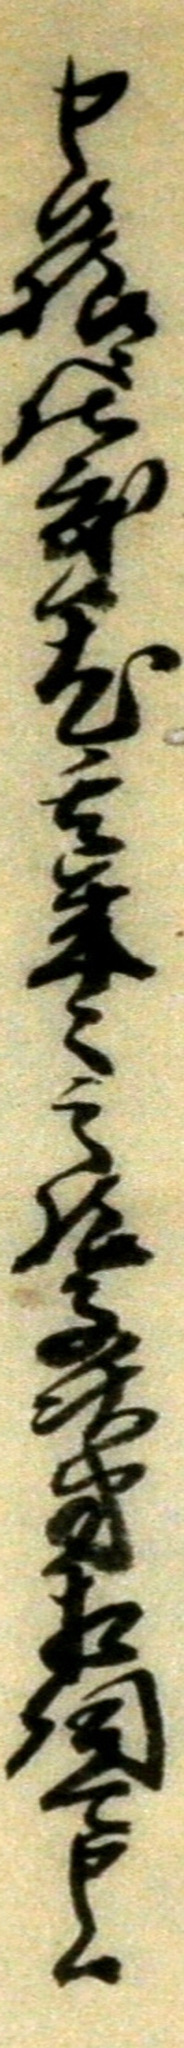申候様ニ仕度候尤其年々之様子次第相伺可申候
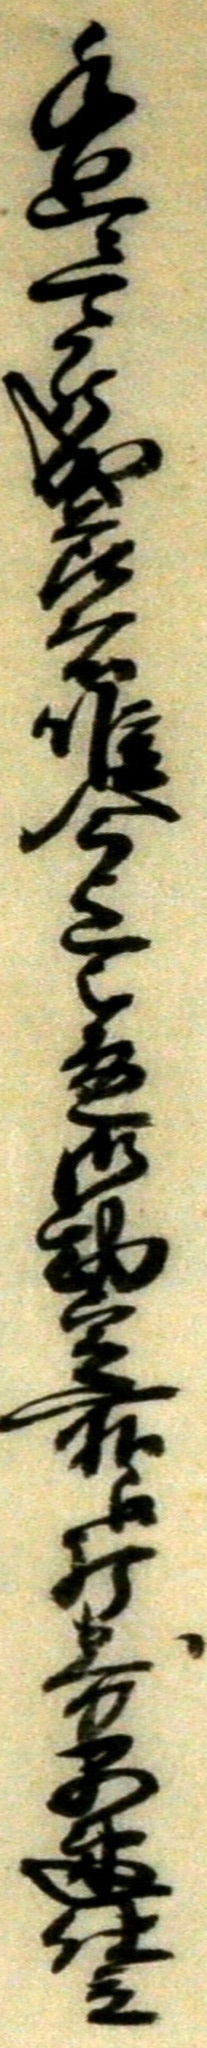手廻ニ可罷成節者唯今迄之通御勘定所江打寄早速仕立
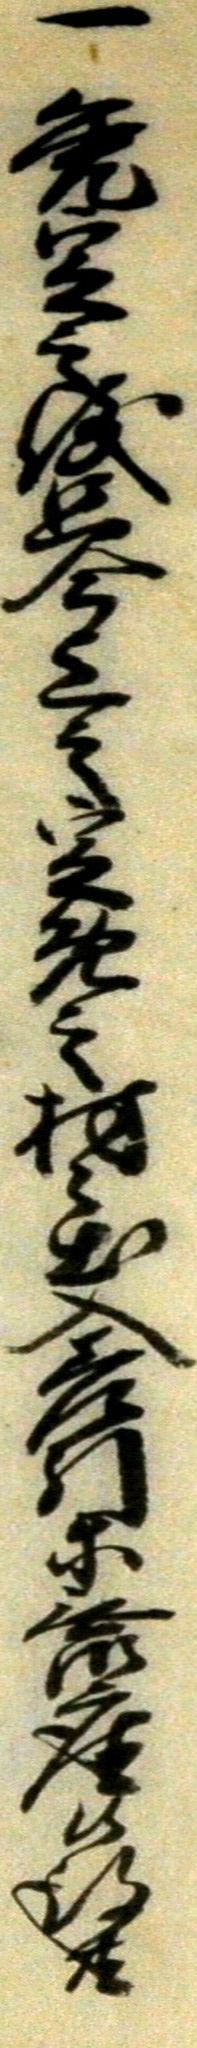一免定之儀只今迄之定免之村々出入差引等無御座候得共
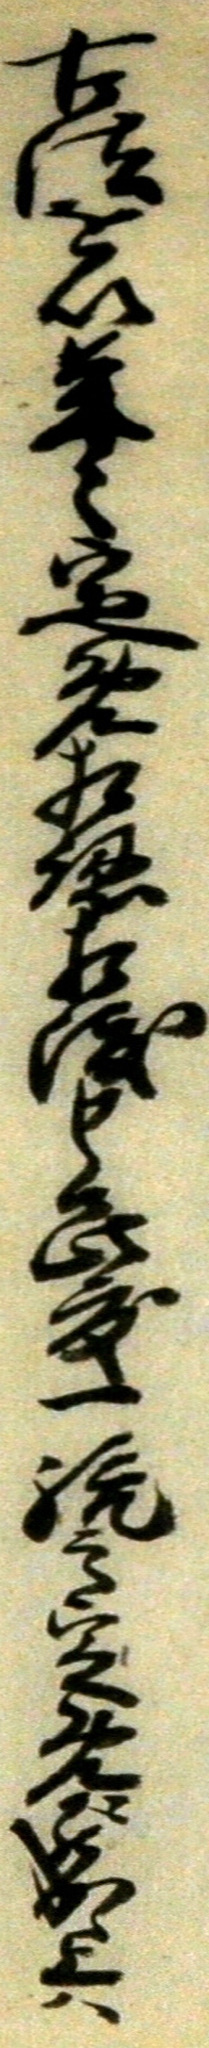古法を以年々定免相認相渡申候此度一統之定免ニ罷成候上ハ
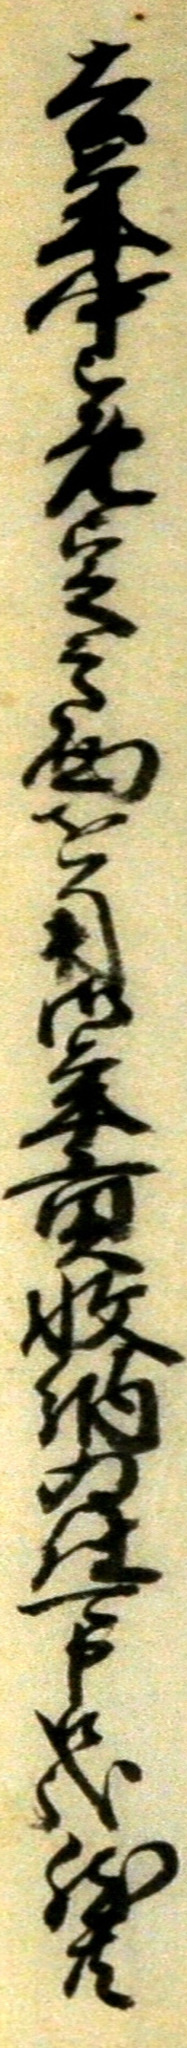去年中之免定之面を用御年貢収納為仕可申候哉然共

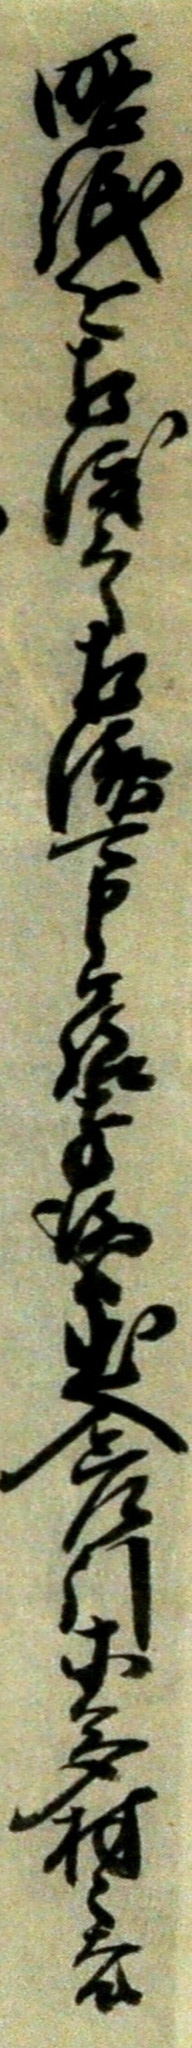略紙を相渡候ハヽ相済可申候様奉存候出入差引等多村々者
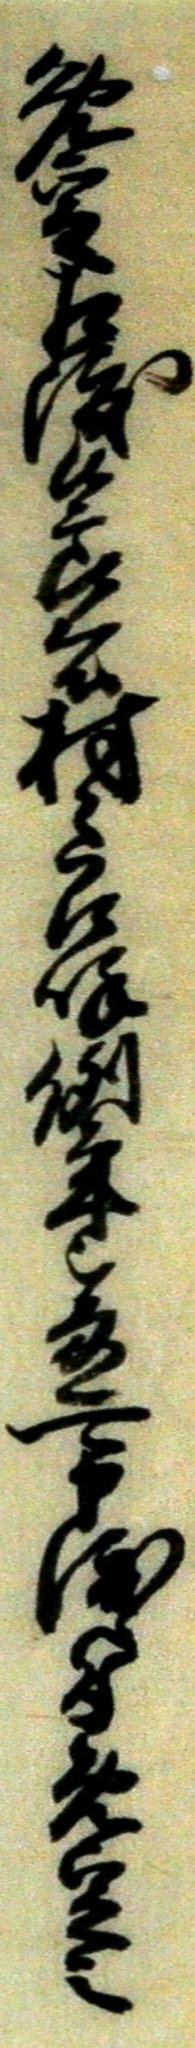免定相渡候節者村々召呼例年之通可申渡ニ付免定之
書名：留書
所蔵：伊那市立高遠町図書館・合同会社AMANE
